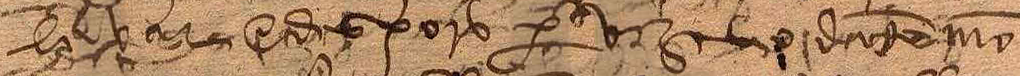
levar e despojs ꝑ vezes dito mō
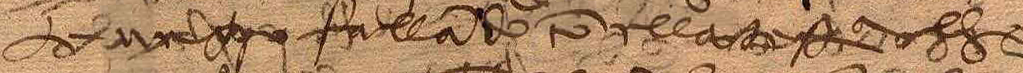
tenegro fallādo cō ella testa lhe
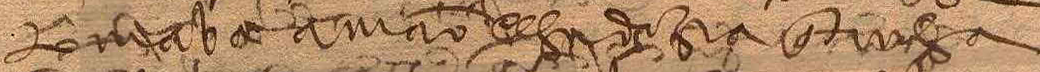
tomava a mão e lhe dizia q̄ tinha
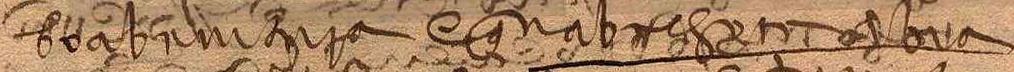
boa vemtura e q̄ na velhyce avia
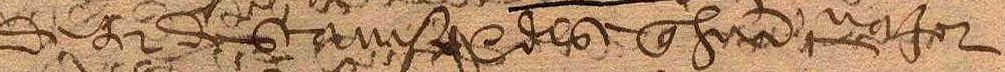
de ter descamso e dise q̄ huā cna Jor
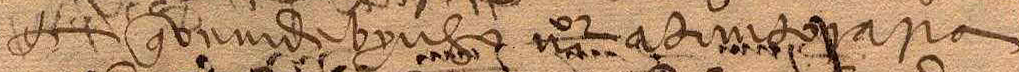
ge q̄ vemde vynho mor a timtoraria
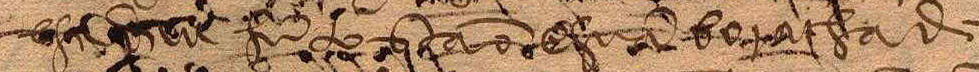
lhe deu hū tostão e huā boracha de
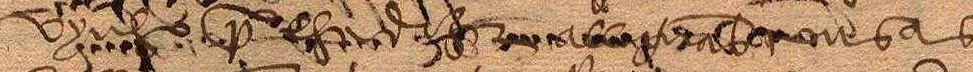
vynho p̄o he dizer allgūas cousas
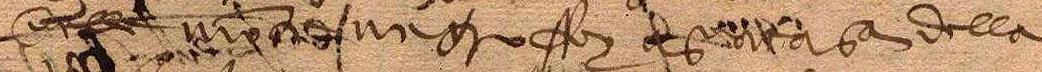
e elle mōtenegro foy a sua casa della
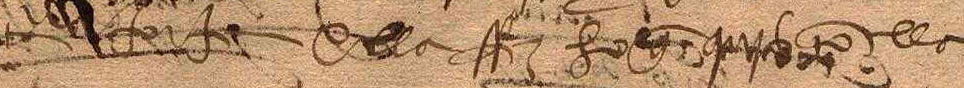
cna JorJe e lla ffez ho q̄ qujs cō ella
